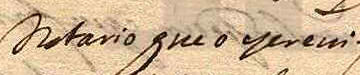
Notario que o escrevi
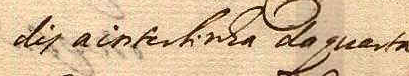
dis a interlinha da quarta
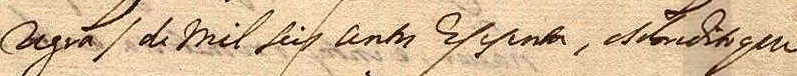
Regra / de mil seis centos E sesenta, o sobredito que
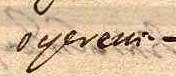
o escreui -
